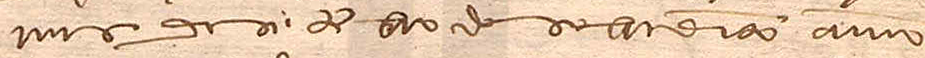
mes de setēbro do sobredito anno
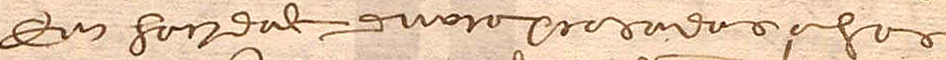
Em ha cjdade deuora e casa das audjas
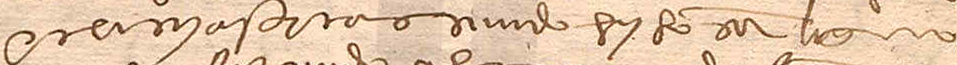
eclesyasticas sendo hy ho s̄or vigro
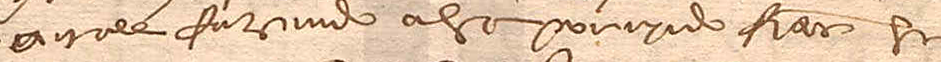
gerall fazemdo audja e ouuyndo fītos he
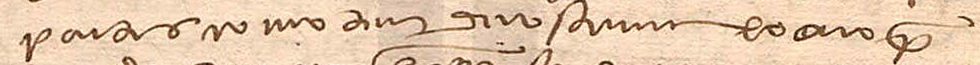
partes como tem de costume loguo p̄o
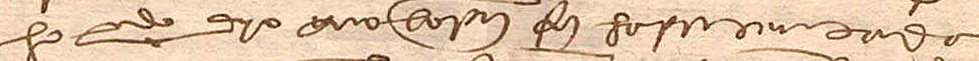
ho Ldo dyoguo lopez foj hapresentada
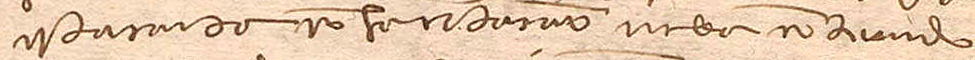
esta carta c̄o ha citação nella c̄oteudo
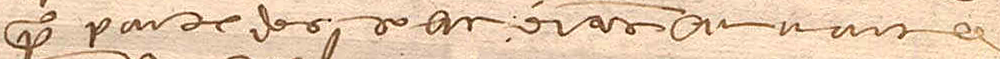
p̄o parte dos sobreditos eu manoell
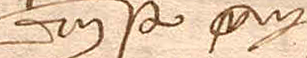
d̄iz esto sp̄uy
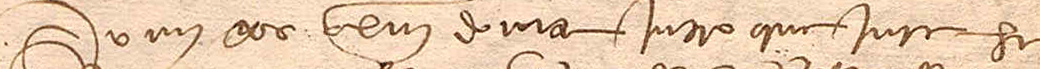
Domjgos āluz doutor Jutroque Jure he
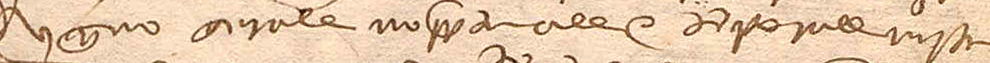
vjgro gerall no sp̄tuall e tēporall neste
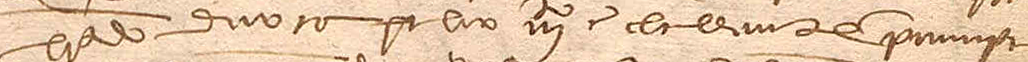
b̄pdo deuora pello mto ēclellente p̄mcepe
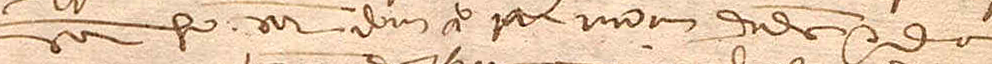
s̄or ho s̄or dom ao por mēçe de d̄s e da
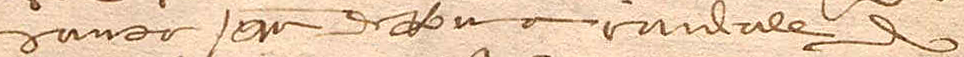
santa Jḡra de Roma cardeall do
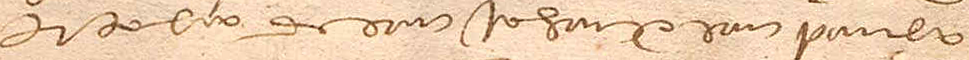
titolo de sam Joham e sam paulo
